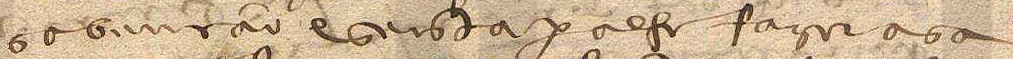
sa benção e se esta ꝑa lhe fazer a sa
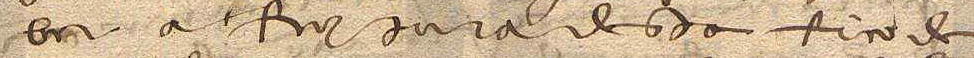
ber a feytura desta fico de
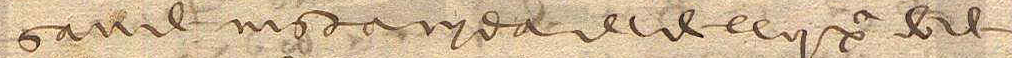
saude nesta cydade de llyxa dōde
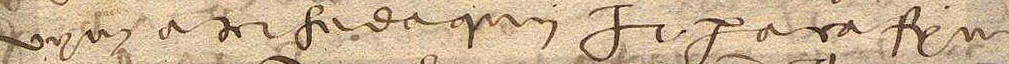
vym a ter he daquy Jr ꝑa çafym
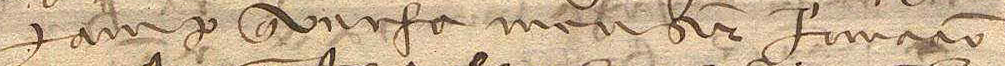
tamto q̄ venha meu sor̄ Jrmaaõ
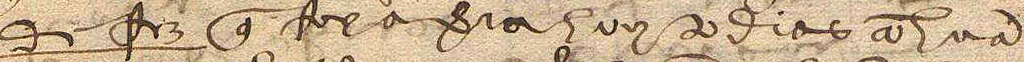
de fez q̄ foy aꝟra hoyto dias c̄o huā
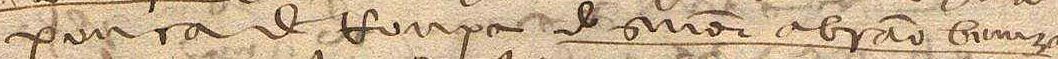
pouca de Roupa do senōr abrão bemza
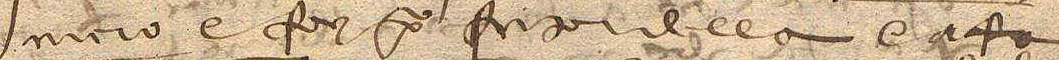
mero e foy p̄o feitor della e a fa
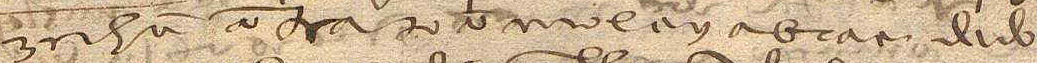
zer hū c̄otrato c̄o moley abrae de do
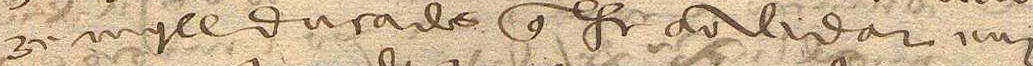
ze myll ducados q̄ lhe aõ de dar em
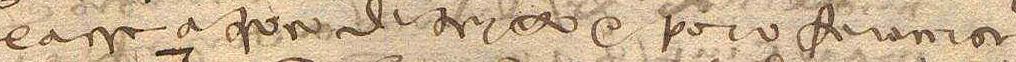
larre a troco de trygo e por oferecer se
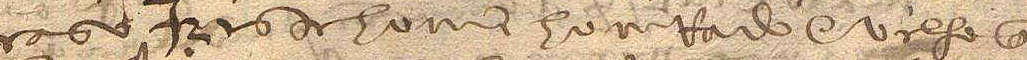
caso Jr este homē homRado e velho q̄
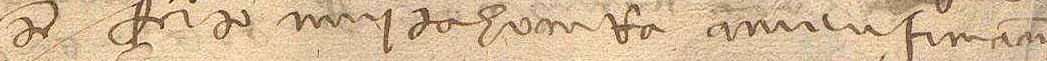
tē feito mujta homRa a meu Jrmaão
